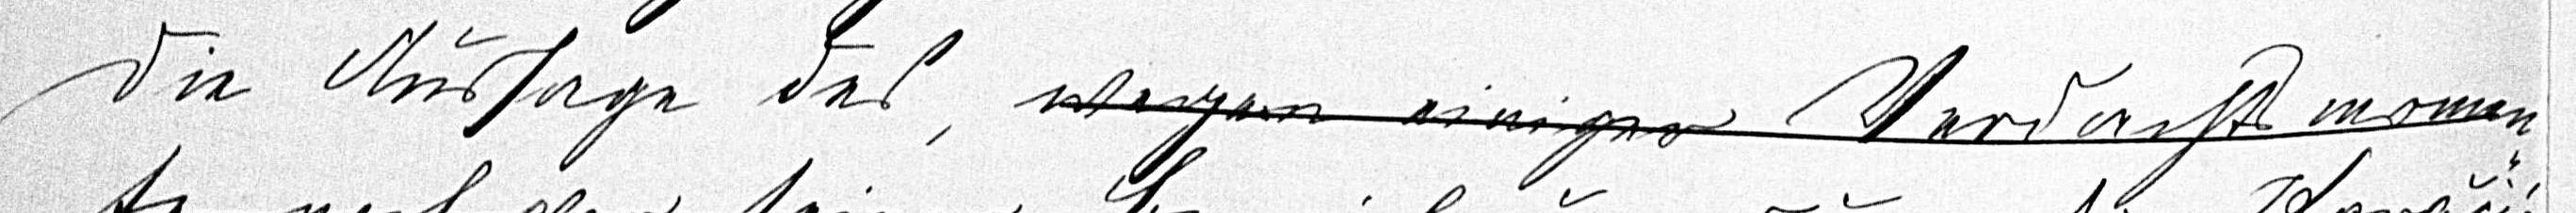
Die Aussage des,
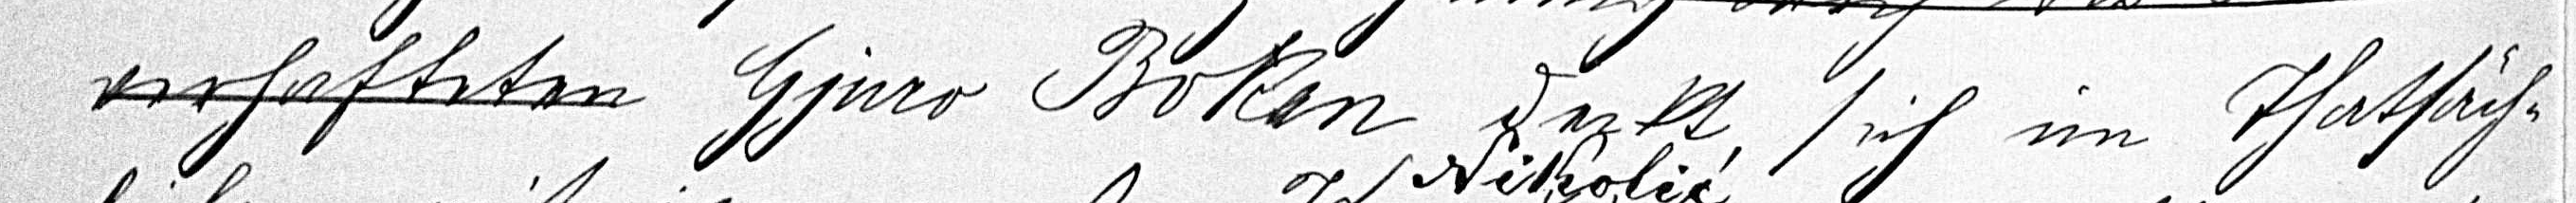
Gjuro Bokan deckt, sich im Thatsäch¬
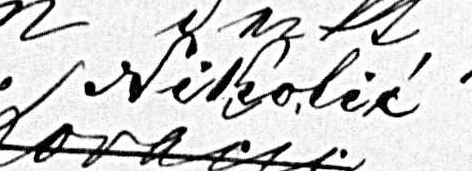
Nitkolić
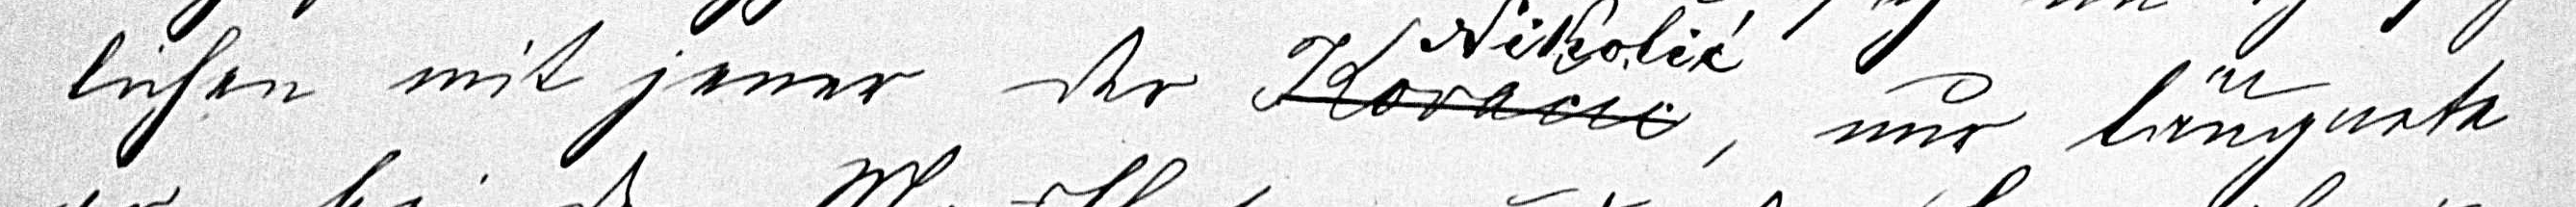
lichen mit jener der, nur längnete
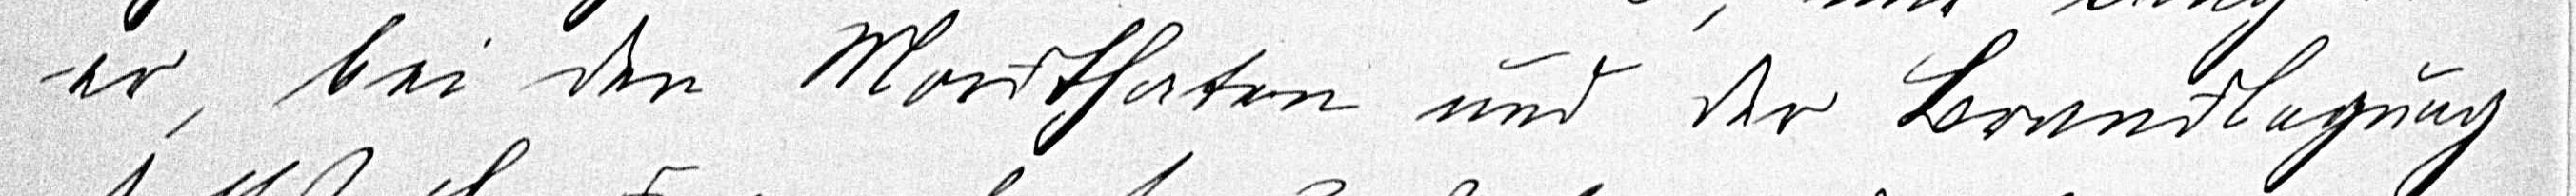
er, bei den Mordthaten und der Brandlegung
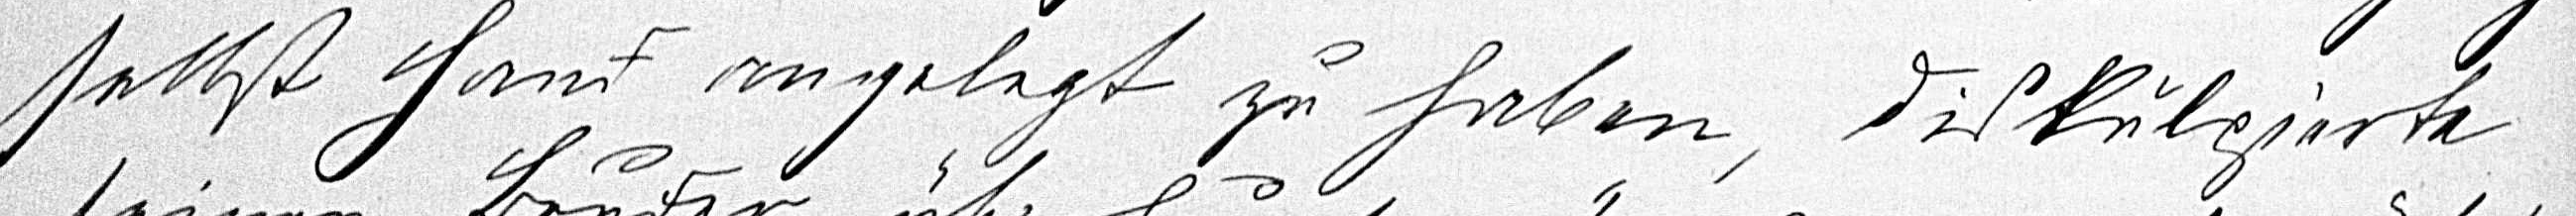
selbst Hand angelegt zu haben, diskulpierte
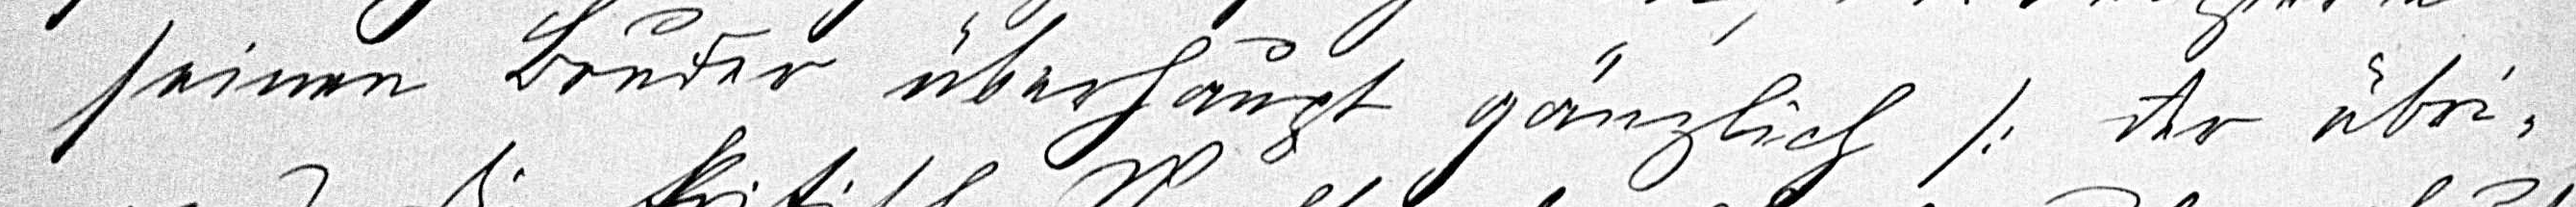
seinen Bruder überhaupt gänzlich /: der übri¬
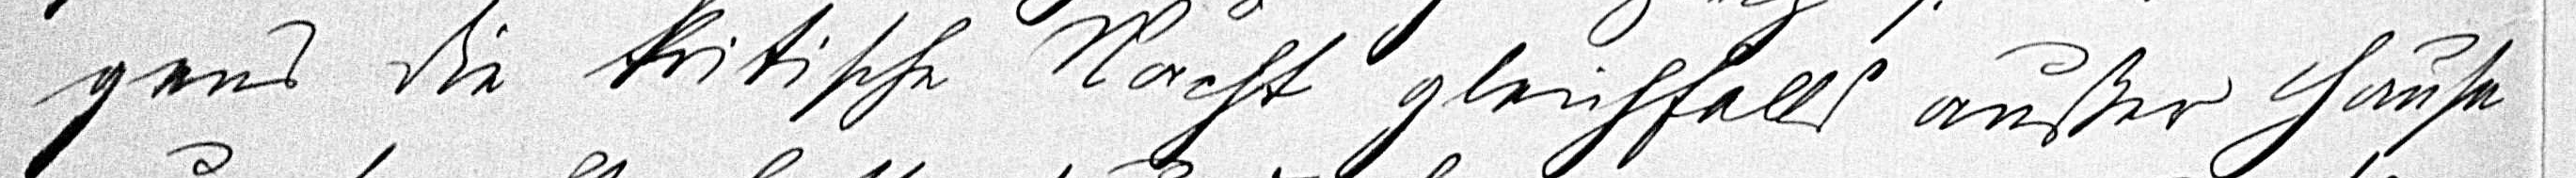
gens die kritische Nacht gleichfalls außer Hause
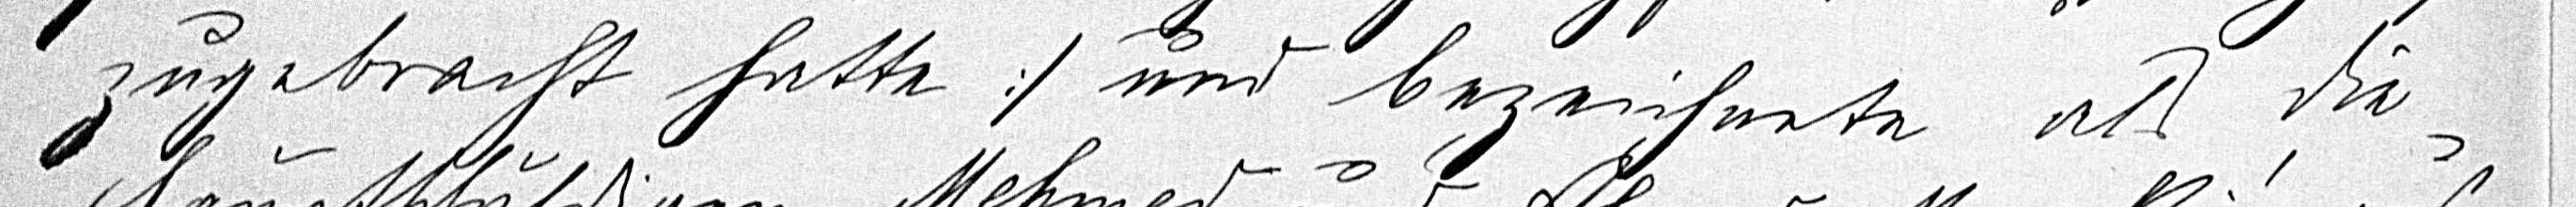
zugebracht hatte :/ und bezeichnete als die
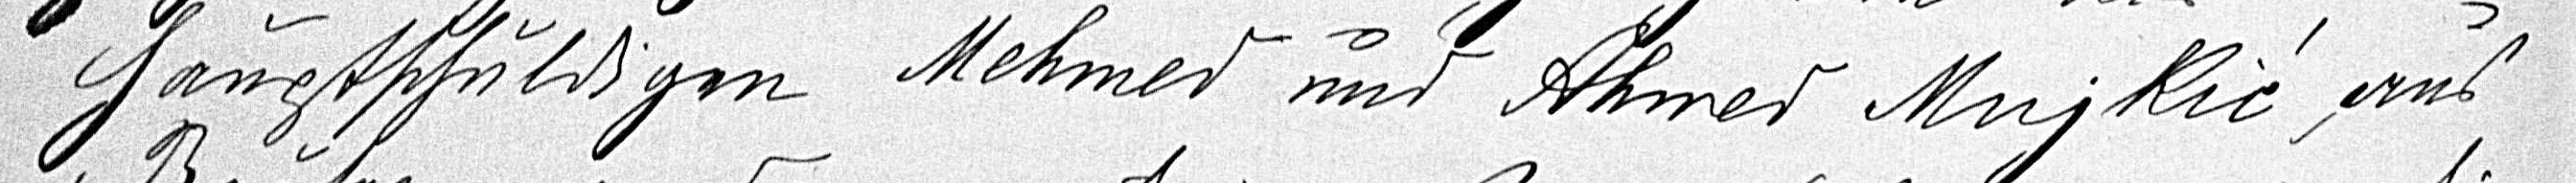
Hauptschuldigen Mehmed und Ahmed Mujkić aus
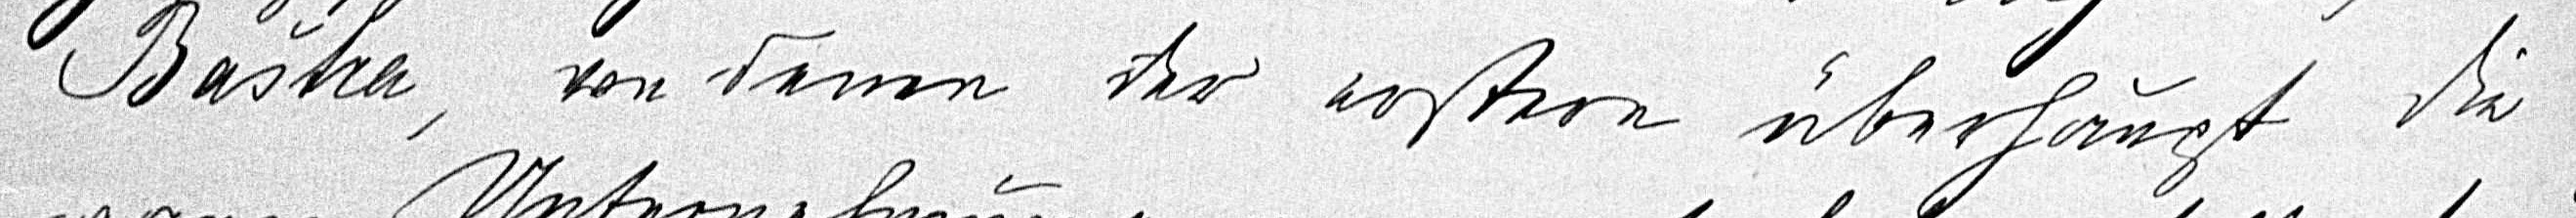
Baštra, von denen der erstere überhaupt die
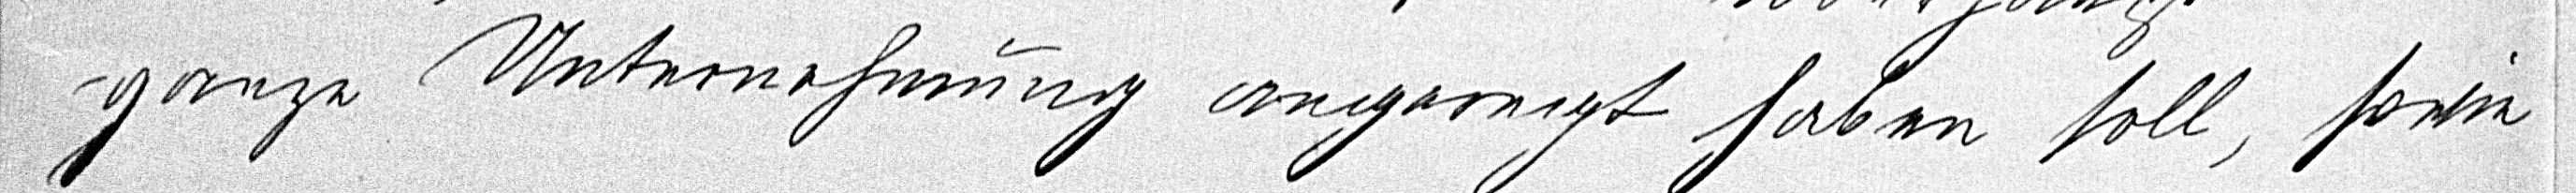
ganze Unternehmung angeregt haben soll, sowie
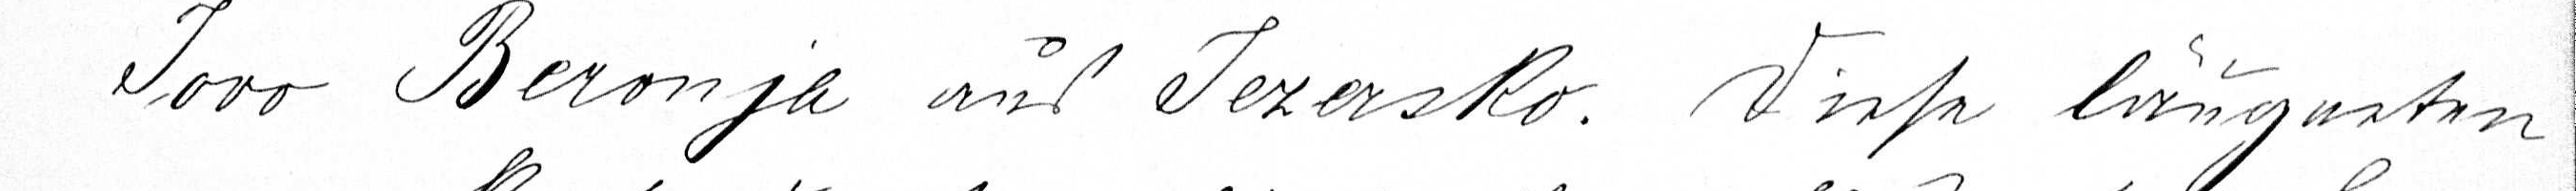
Jovo Beronja aus Jezersko. Diese läugneten
